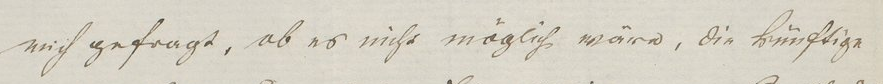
mich gefragt, ob es nicht möglich wäre, die künftige
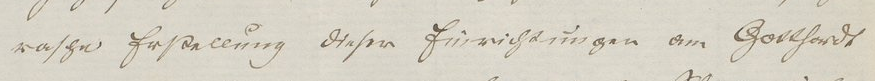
rasche Erstellung dieser Einrichtungen am Gotthardt
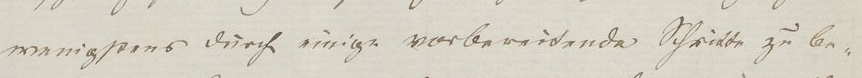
wenigstens durch einige vorbereitende Schritte zu be-
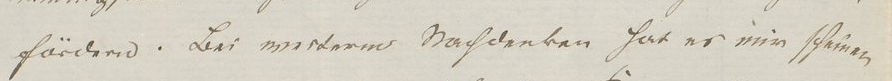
fördern. Bei weiterm Nachdenken hat es mir scheinen
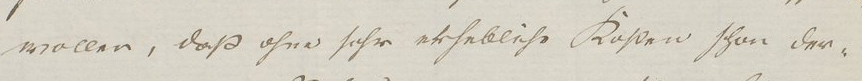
wollen, daß ohne sehr erhebliche Kosten schon der-
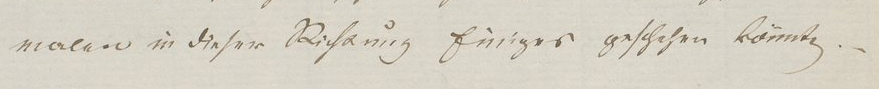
malen in dieser Richtung Einiges geschehen könnte. –
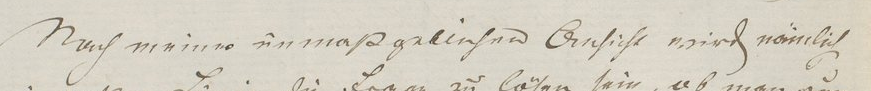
Nach meiner unmaßgeblichen Ansicht wird nämlich
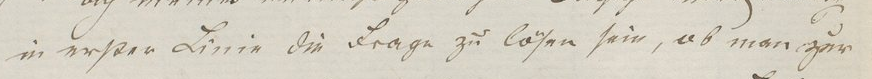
in erster Linie die Frage zu lösen sein, ob man zur
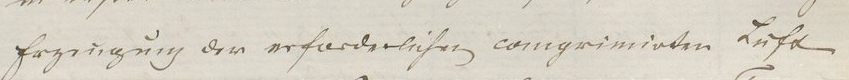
Erzeugung der erforderlichen comprimirten Luft
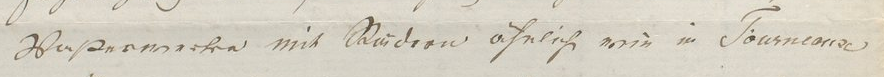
Waßerwerke mit Rädern ähnlich wie in Fourneaux
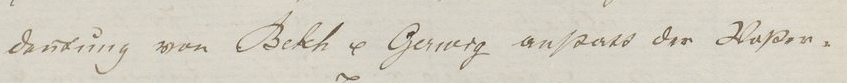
deutung von Bekh & Gerwig anstatt der Waßer-
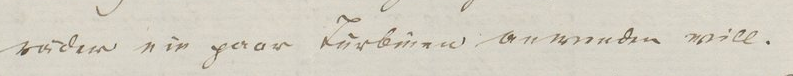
räder ein paar Turbinen anwenden will.
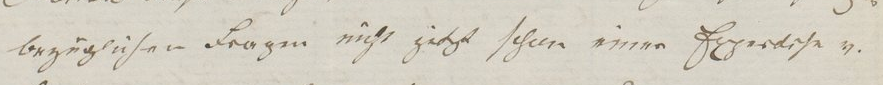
bezüglichen Fragen nicht jetzt schon einer Expertise v.
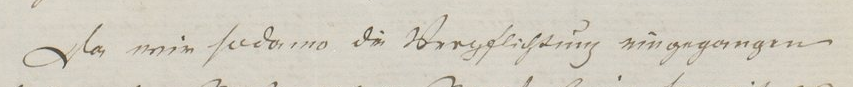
Da wir sodann die Verpflichtung eingegangen
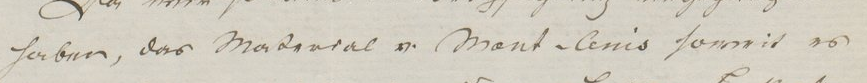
haben, das Material v. Mont-Cenis soweit es
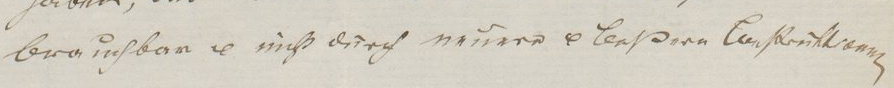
brauchbar & nicht durch neuere & beßere Construktionen
